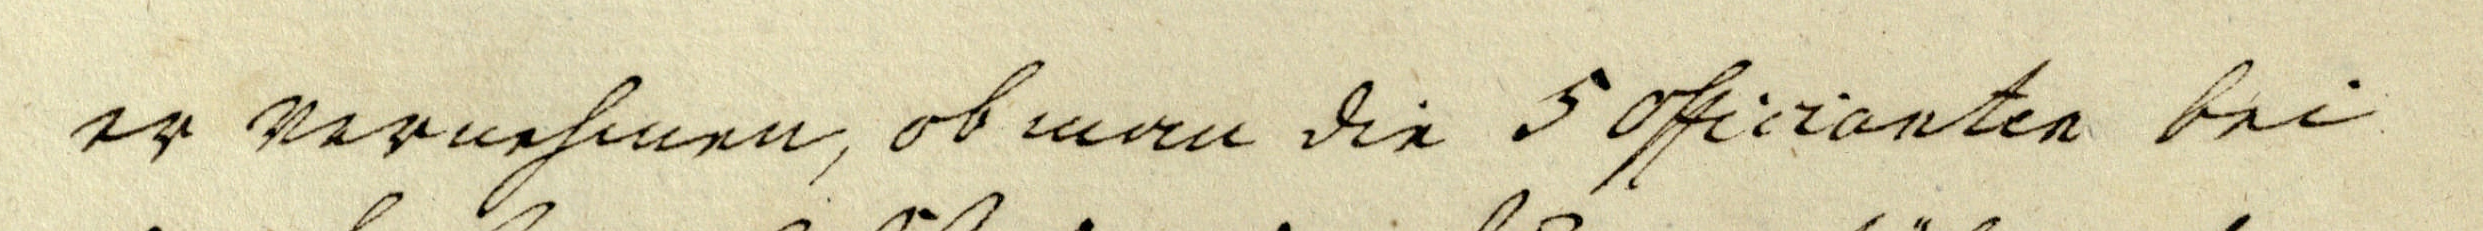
er vernehmen, ob man die 5 Officianten bei
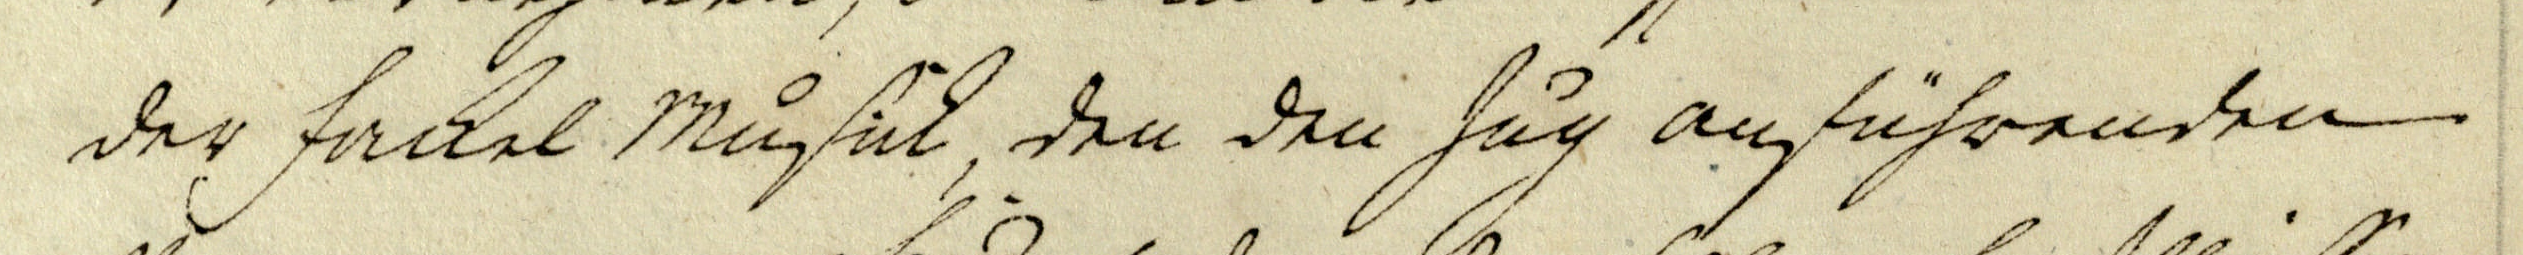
der Fackel Musick, den den Zug anführenden
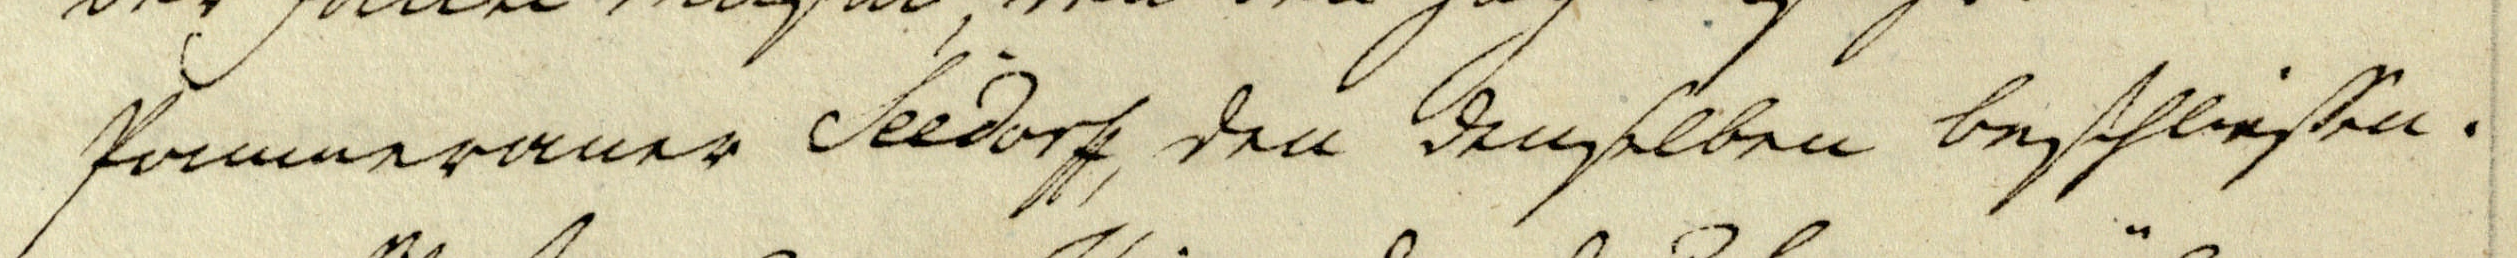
Pommeraner Seedorff, den denselben beschliessen¬
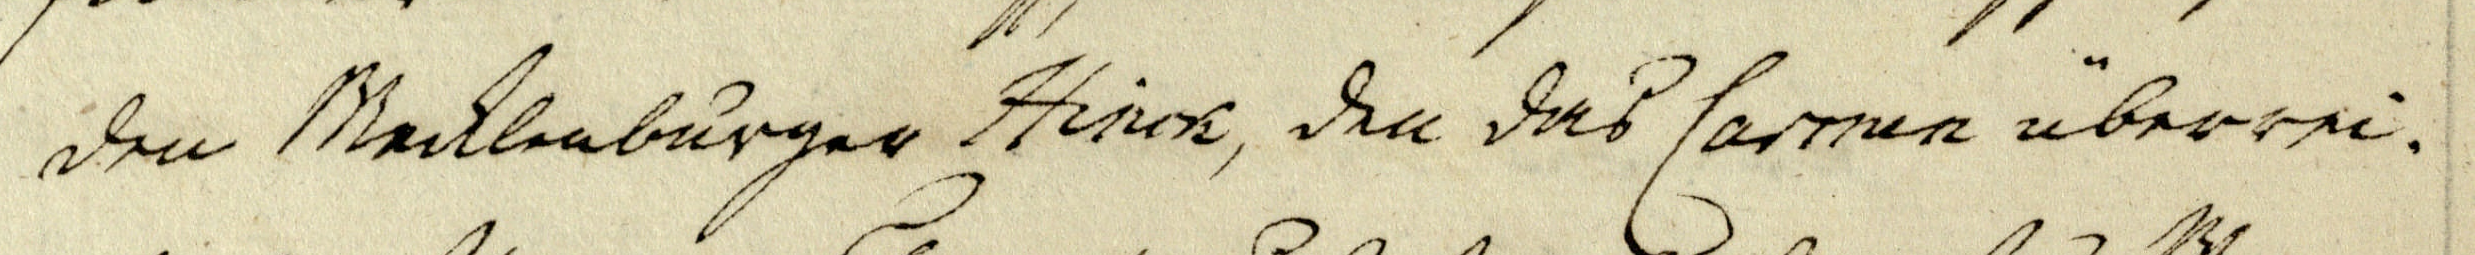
den Mecklenburger Hinck, den das Carmen überrei¬
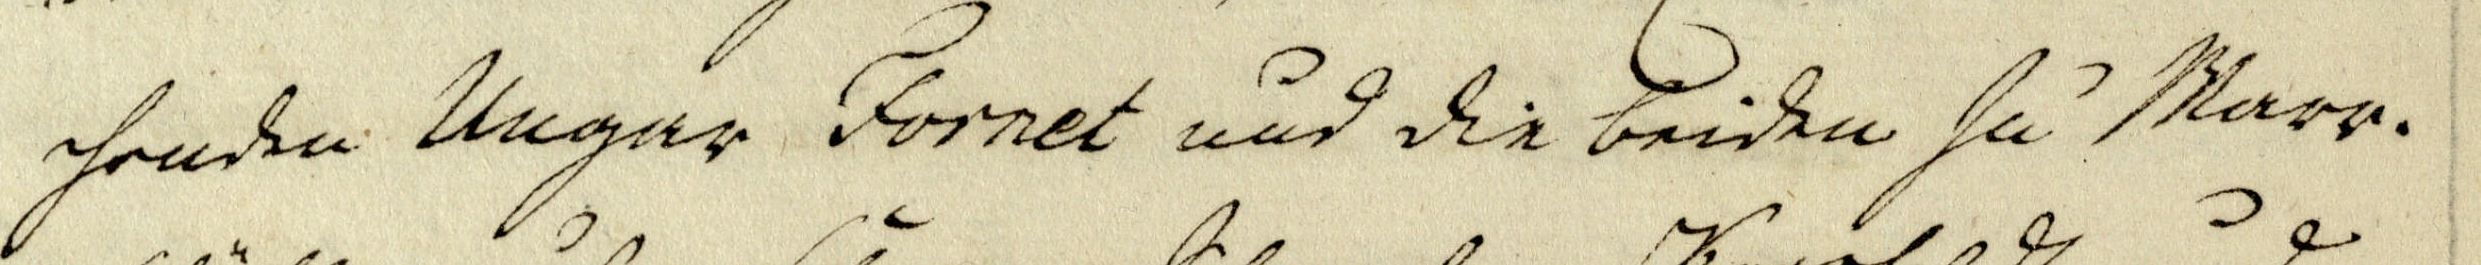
chenden Ungar Fornet und die beiden zu Marr¬
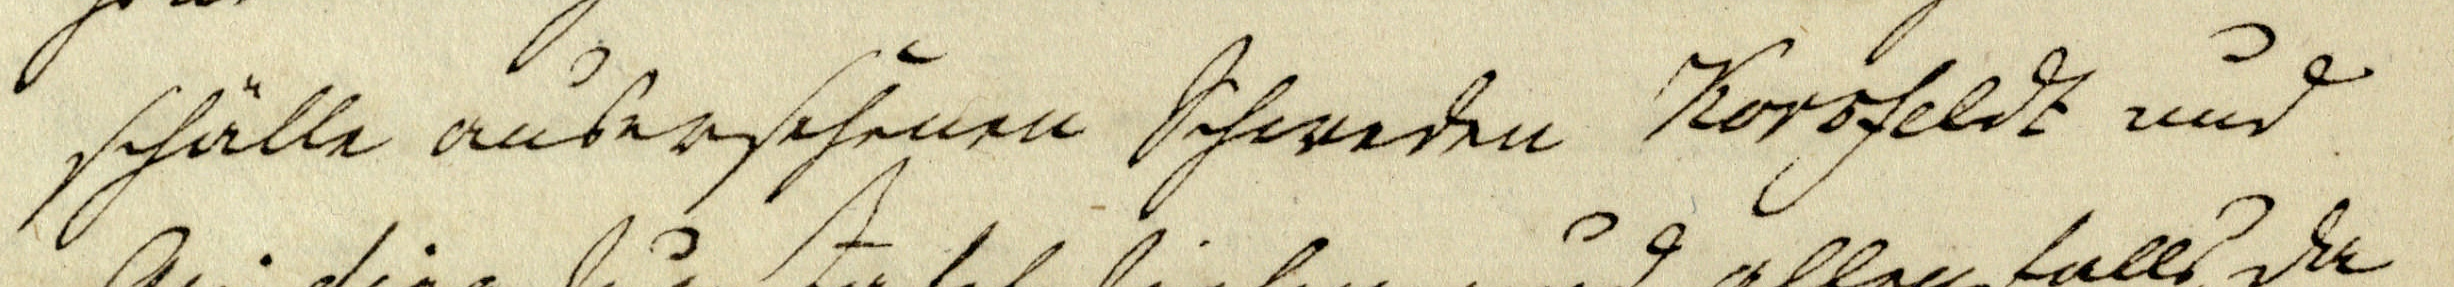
schälle ausersehenen Schweden Korsfeldt und
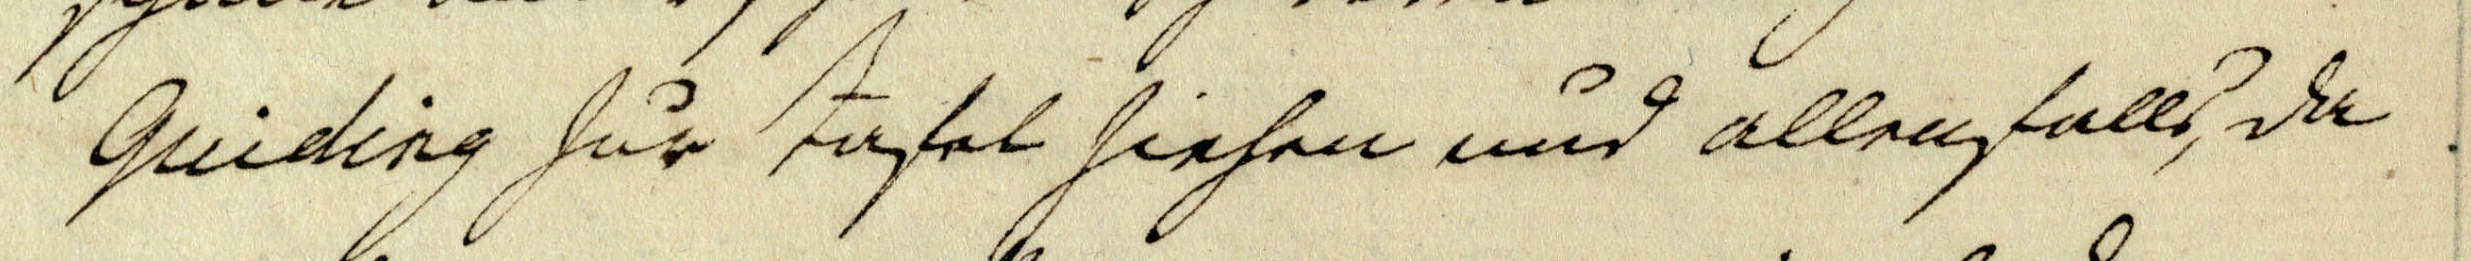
Quiding zur Tafel ziehen und allenfalls, da
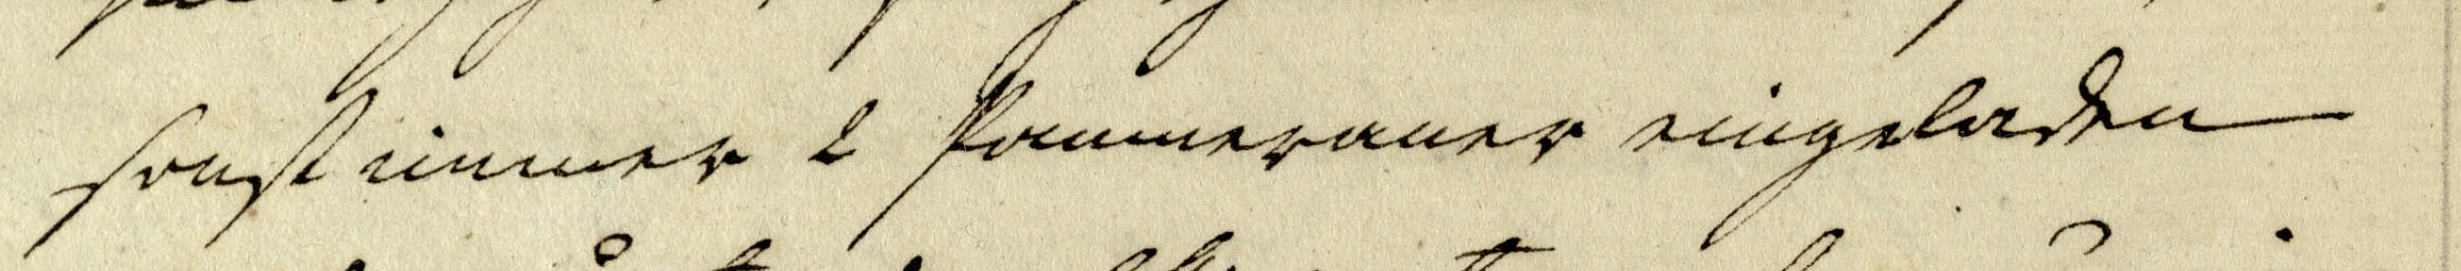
sonst immer 2 Pommeraner eingeladen
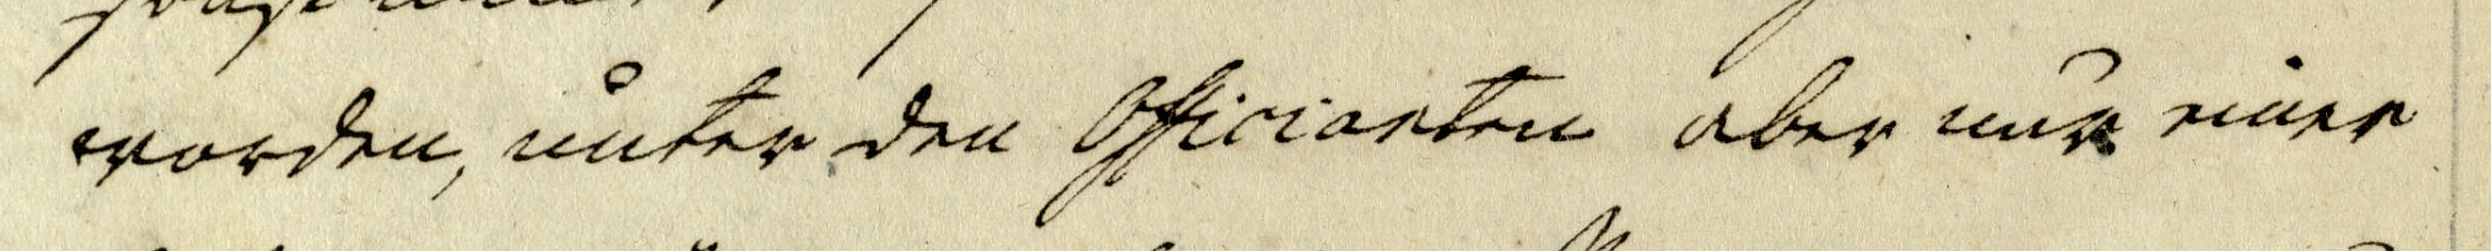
worden, unter den Officianten aber nur einer
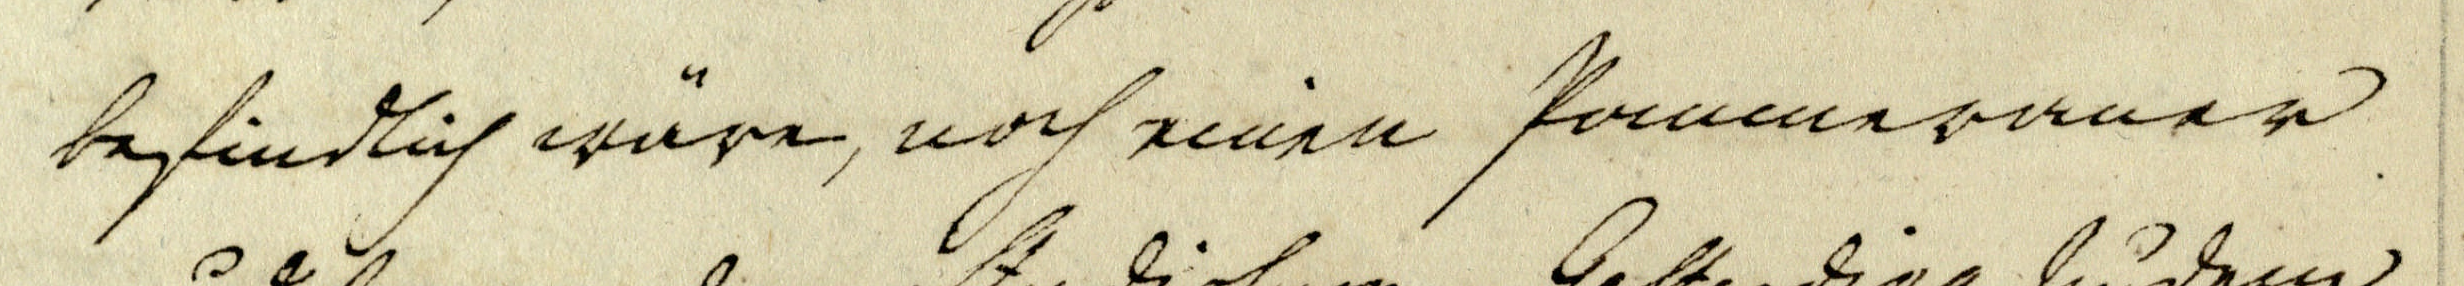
befindlich wäre, noch einen Pommeraner
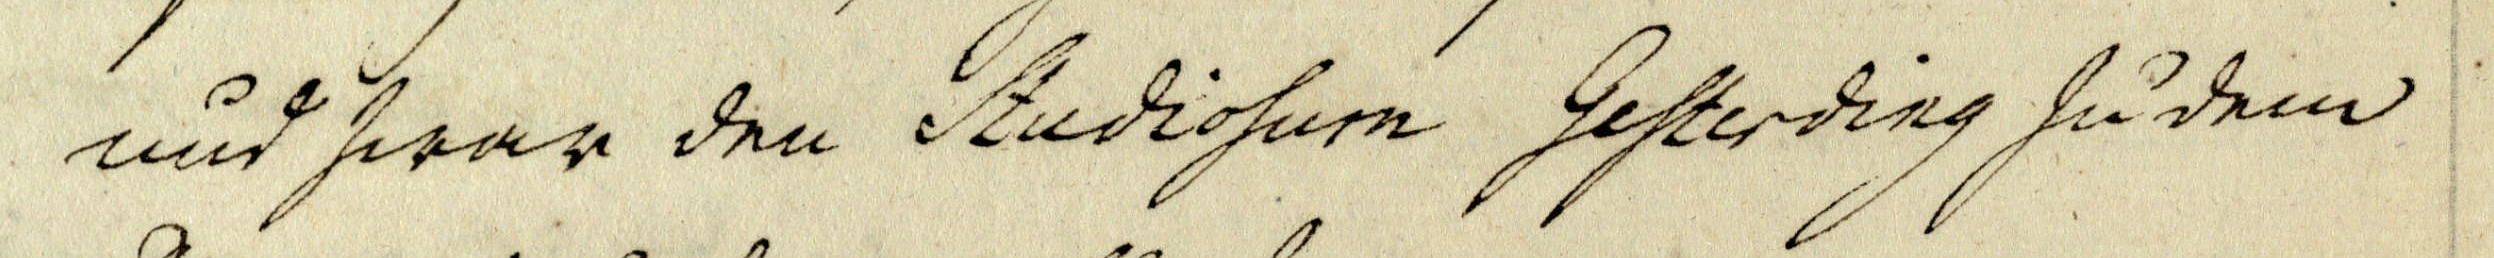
und zwar den Studiosum Gesterding zu dem
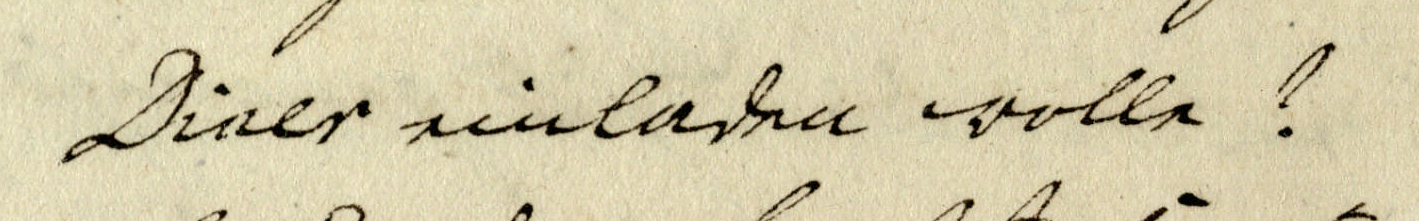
Diner einladen wolle ?
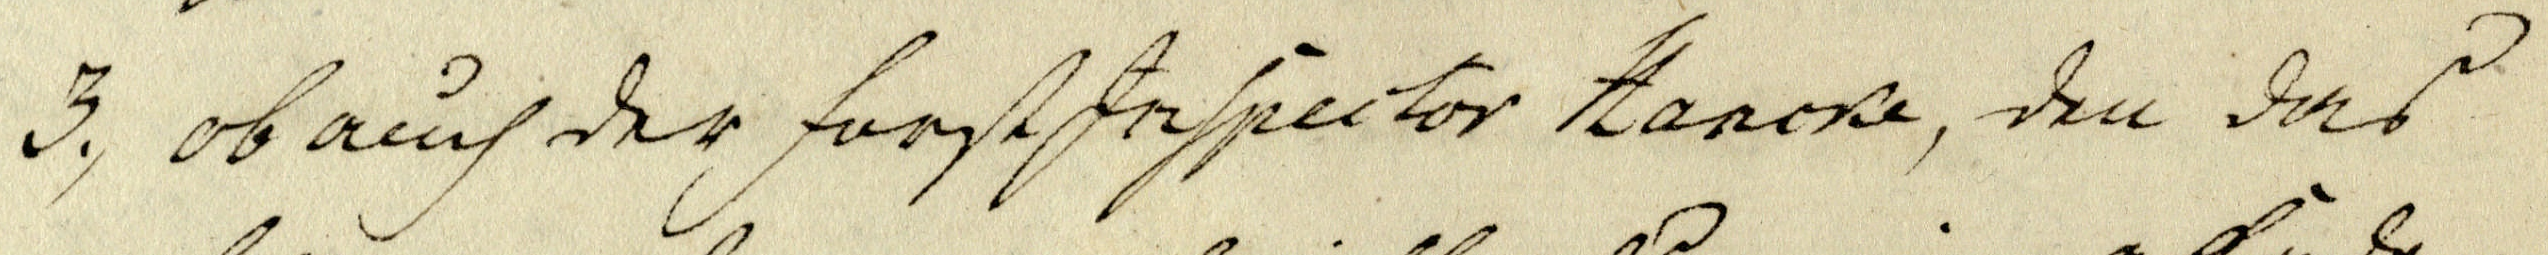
3., ob auch der ForstInspector Hancke, den das
